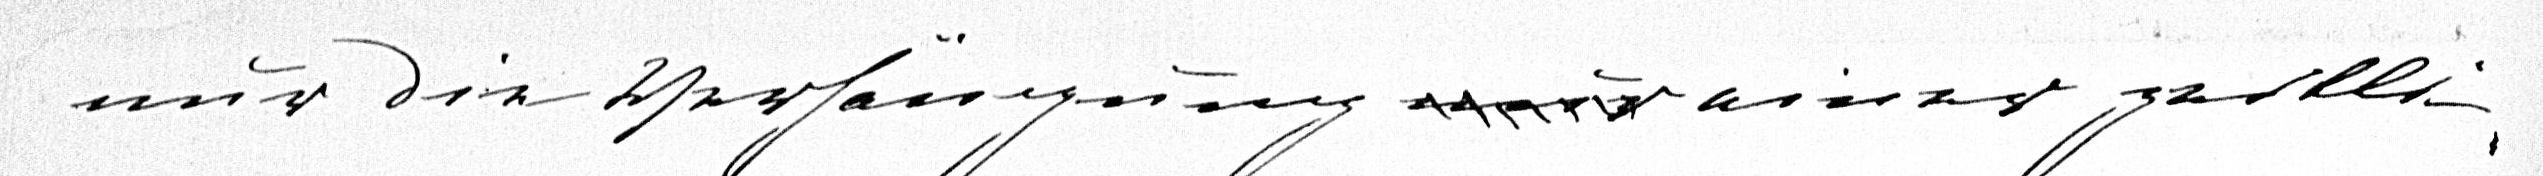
nur die Verhängung einer zeitli¬
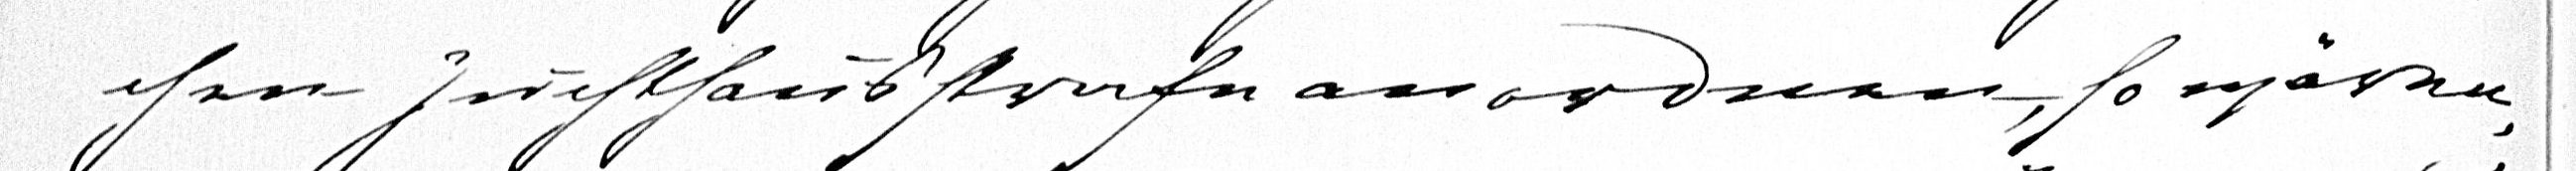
chen Zuchthausstrafe anordnen, so wären,
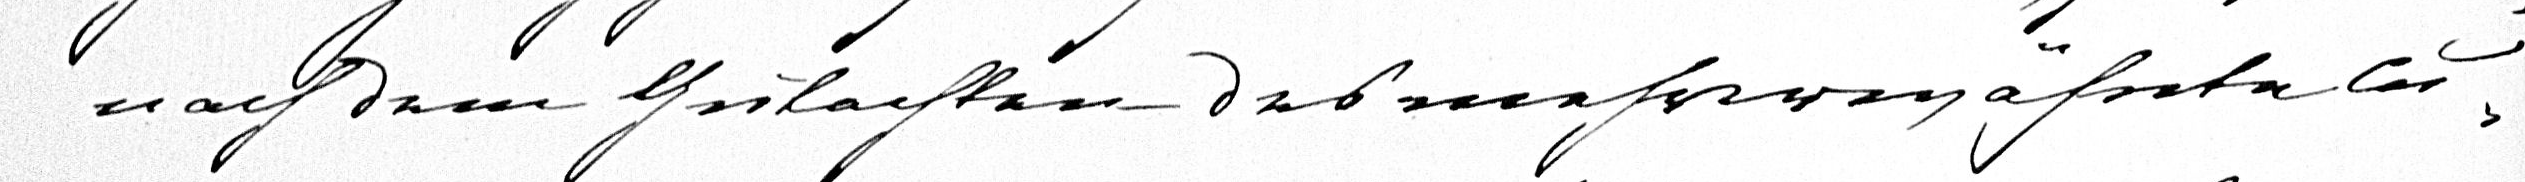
nach dem Gutachten des mehrerwähnte cu¬
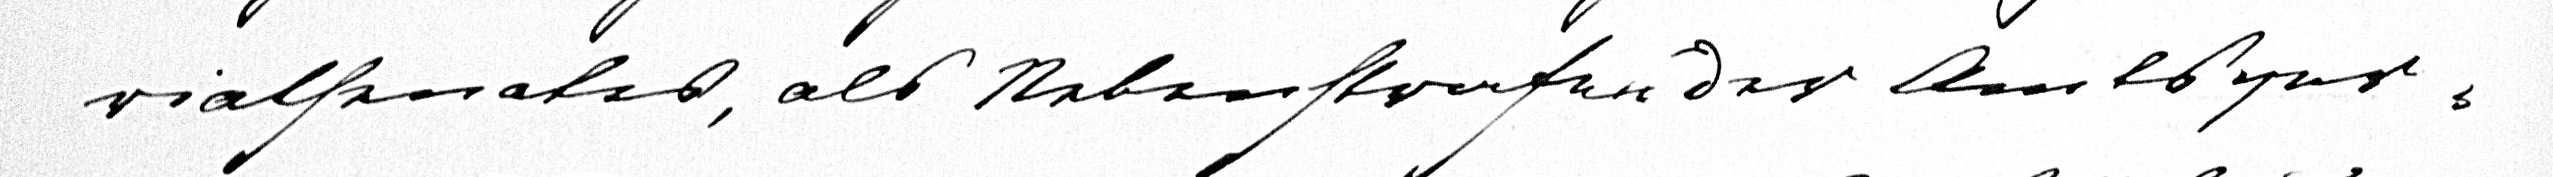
rialsenates, als Nebenstrafen der Amtsver¬
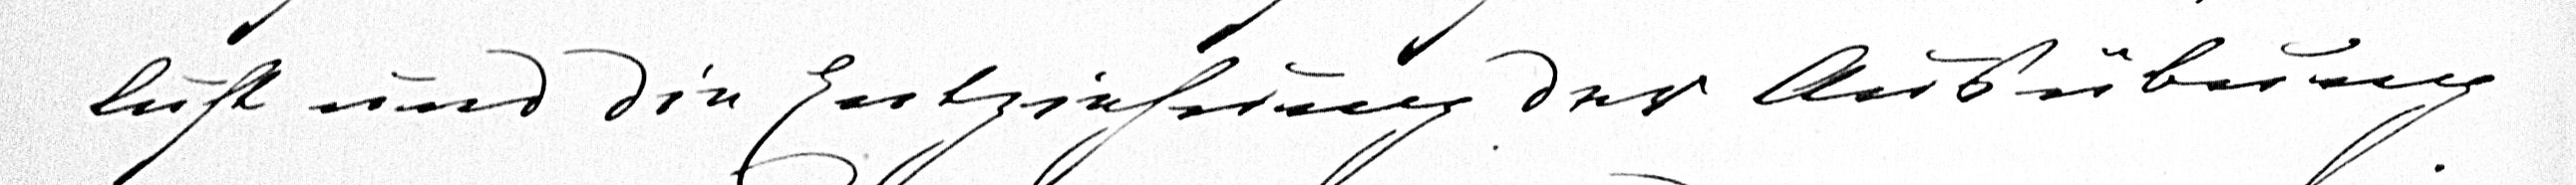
lust und die Entziehung der Ausübung
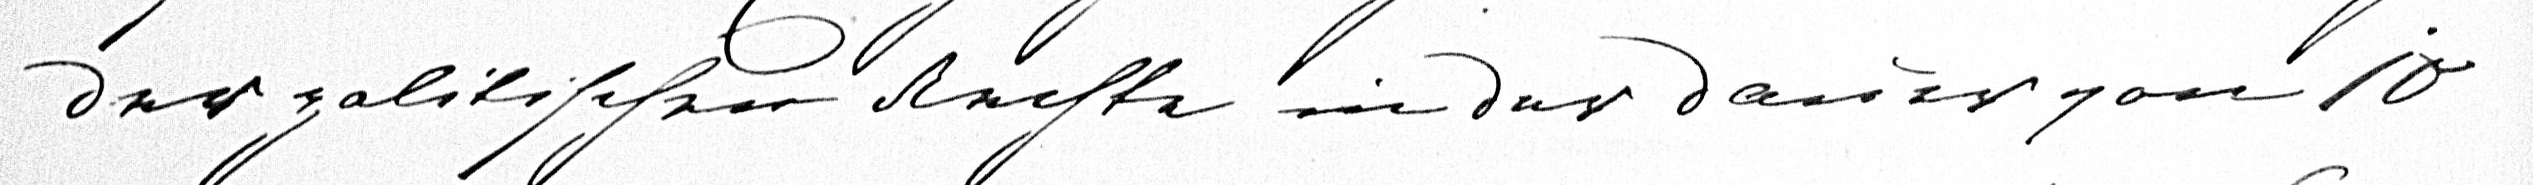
der zalitischen Rechte in der dauer von 10
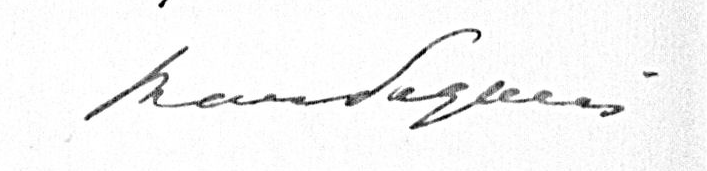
Kansazain
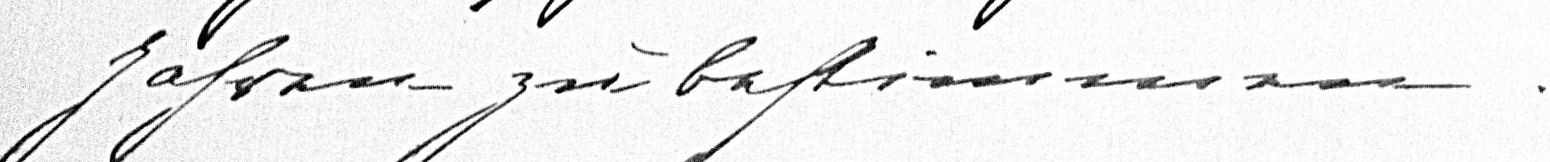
Jahren zu bestimmen.
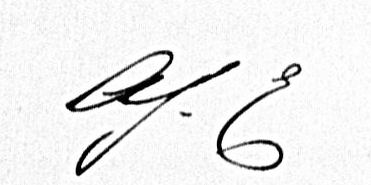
G. C
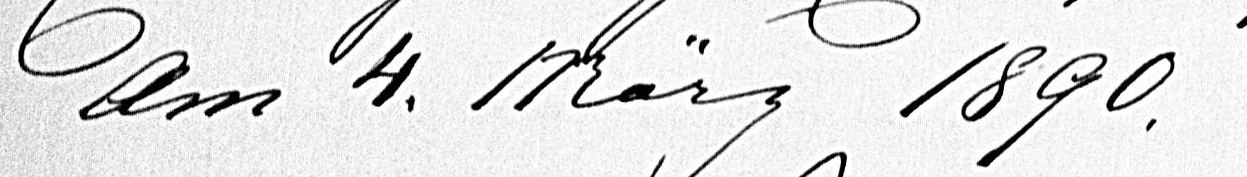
Am 4. März 1890.
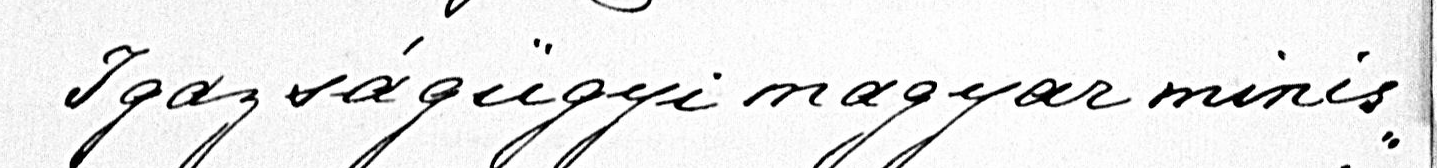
Igazságügyi magyar minis¬
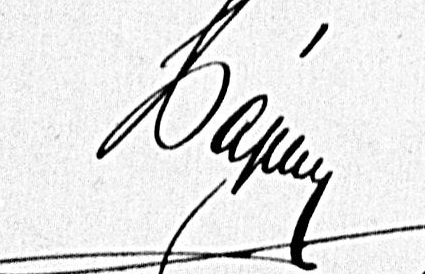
xx
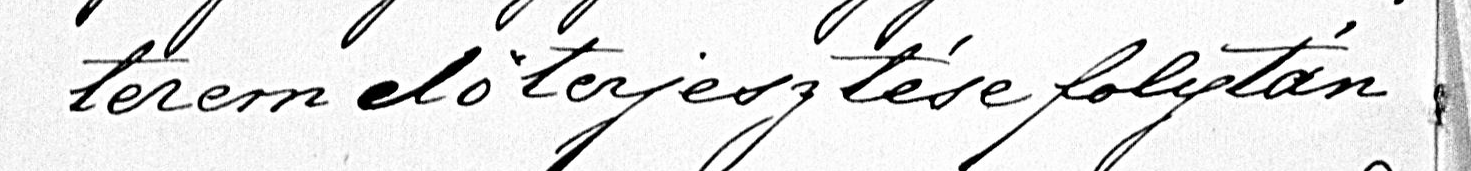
terern elöterjesztése folgtán
